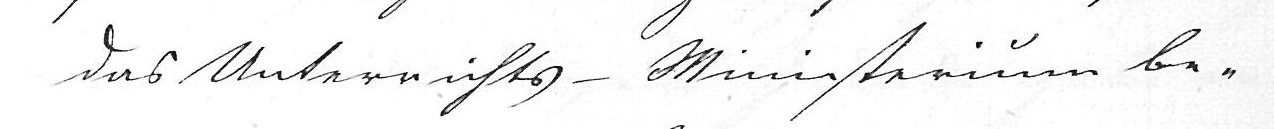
das Unterrichts-Ministerium be-
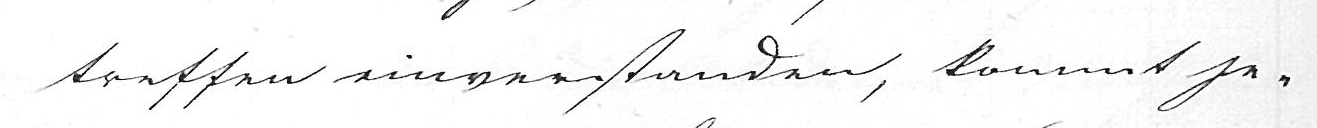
treffen einverstanden, kommt je-
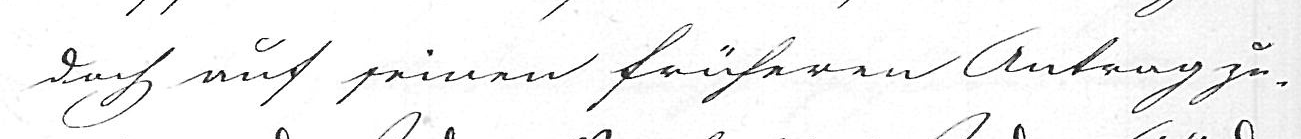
doch auf seinen früheren Antrag zu-
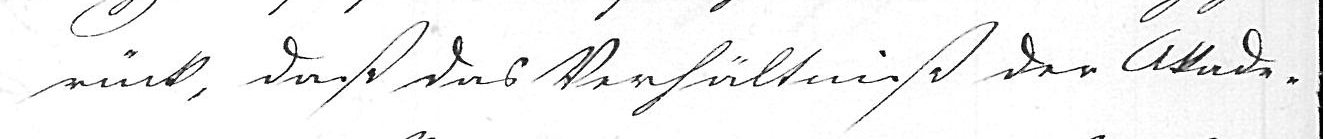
rück, daß das Verhältniß der Akade-
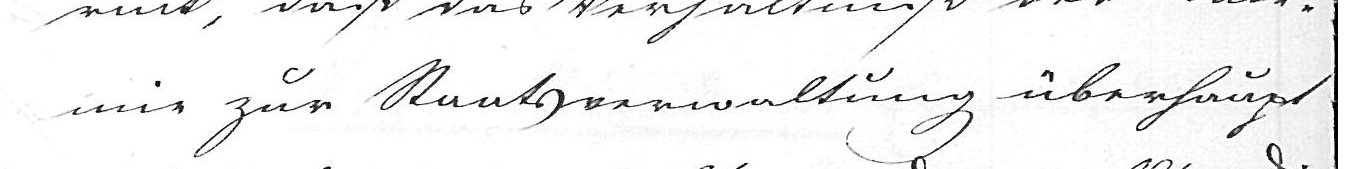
nur zur Staatsverwaltung überhaupt
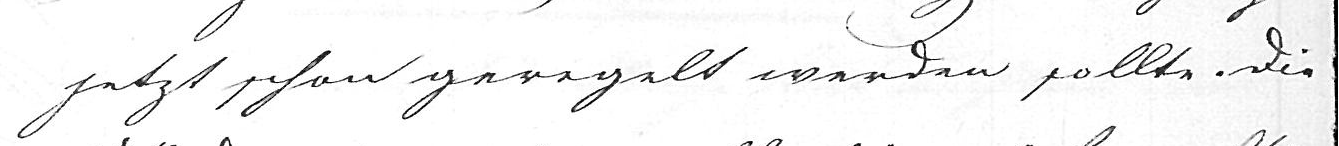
jetzt schon geregelt werden sollte. Die
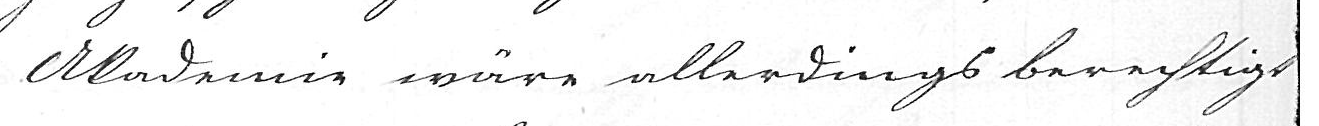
Akademie wäre allerdings berechtigt
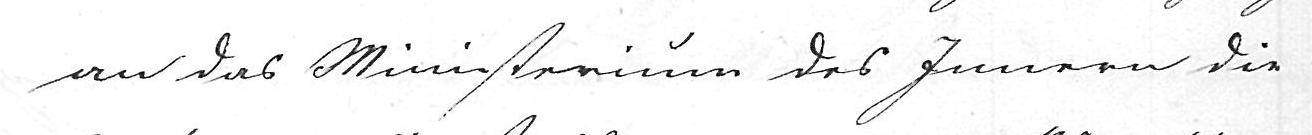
an das Ministerium des Innern die
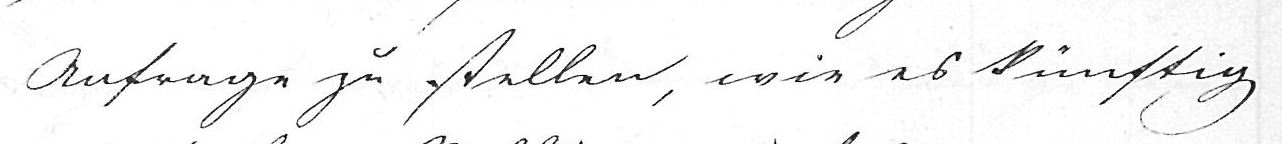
Anfrage zu stellen, wie es künftig
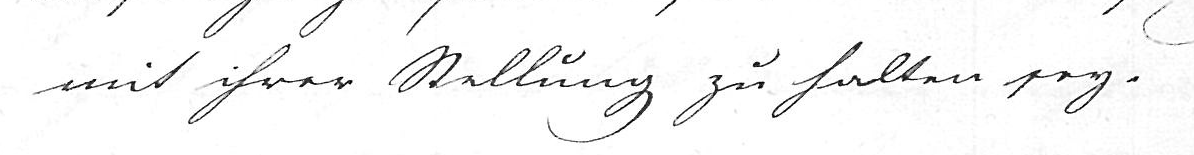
mit ihrer Stellung zu halten sey.
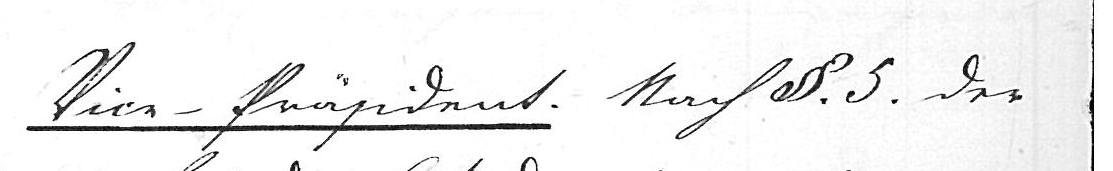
Vice-Präsident: Nach §.5. der
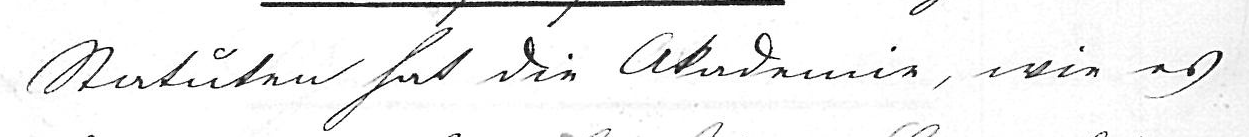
Statuten hat die Akademie, wie es
